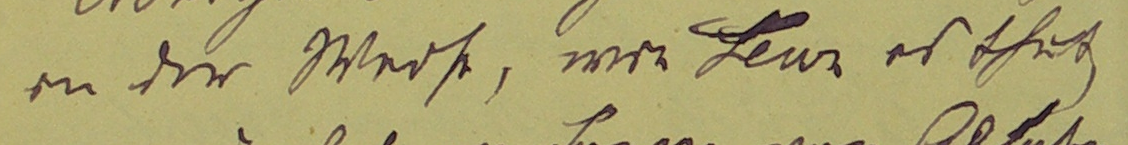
in der Weise , wie Lew es that
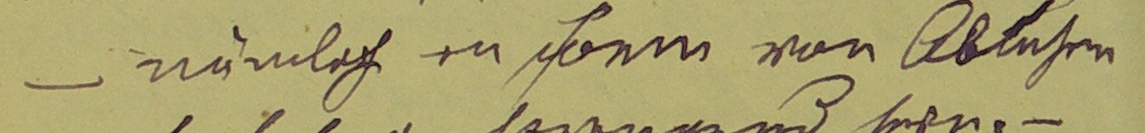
- nämlich in Form von Ablesen
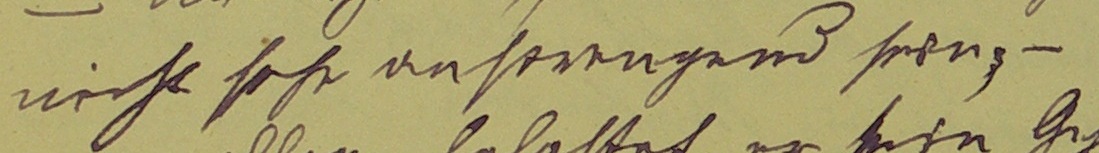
nicht sehr anstrengend sein.—
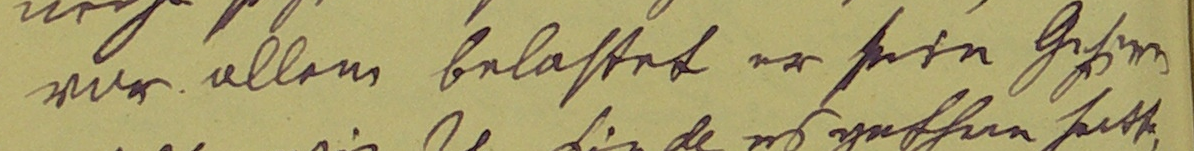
vor allem belastet es sein Gehirn
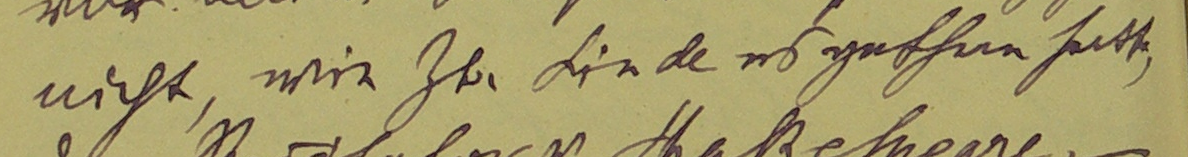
nicht, wie Zb.. Linde es gethan hatte
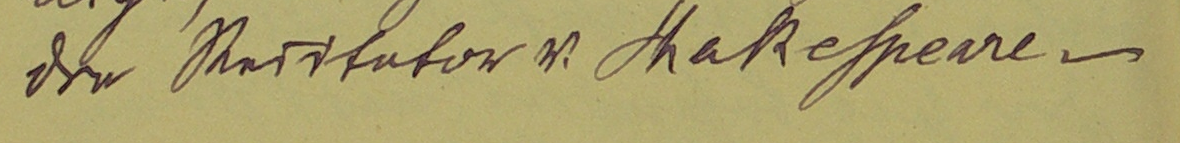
der Rezitator von Shakespeare—
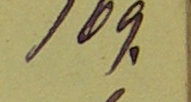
169
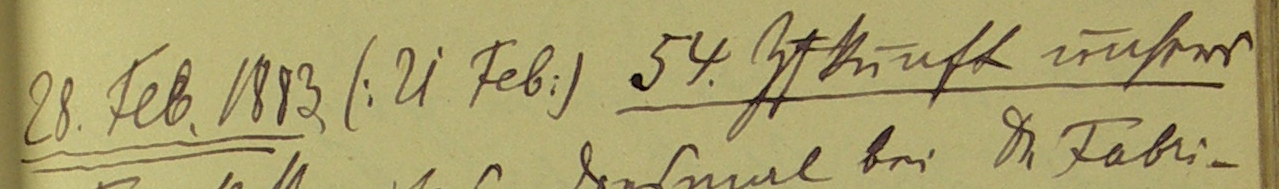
28. Februar 1883 ( : 21 Febr. : ), 54.Zusammenkunft unseres
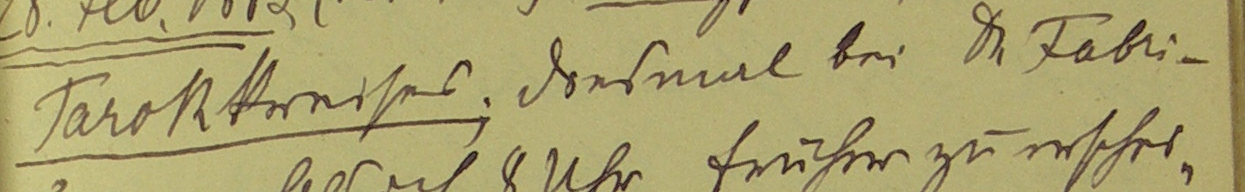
Tarokkreises. Diesmal bei Dr. Fabri¬
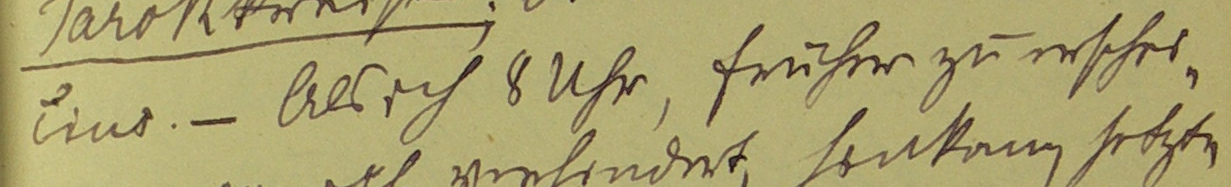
cius.- Als ich 8 Uhr, früher zu erschei¬
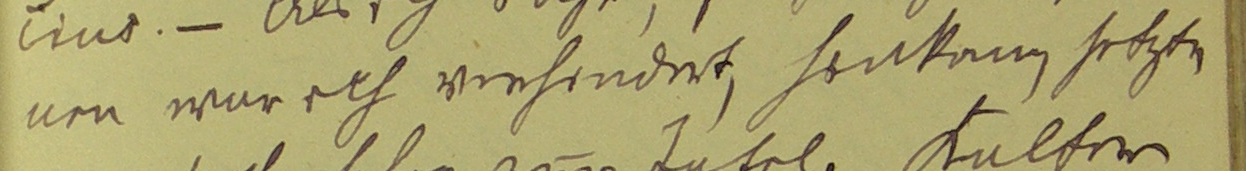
nen war ich verhindert, hinkam setzte
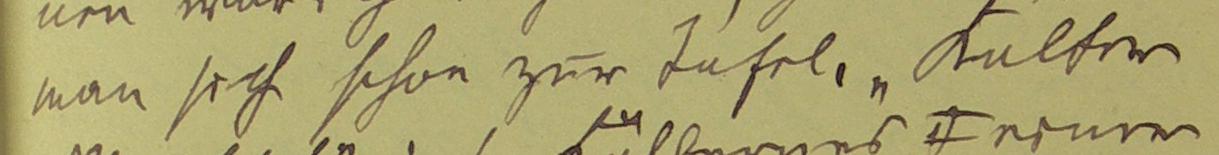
man sich schon zur Tafel. „ kalter
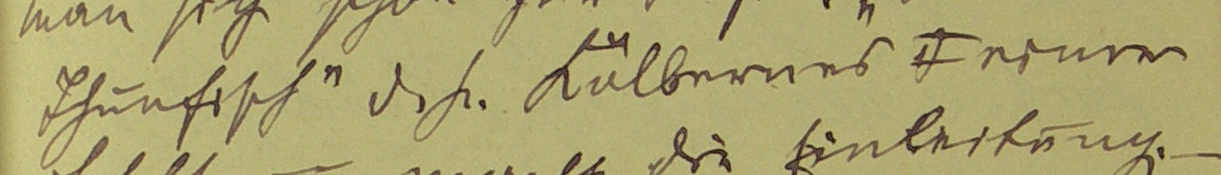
Thunfisch“ dann Kälbernnes mit einem
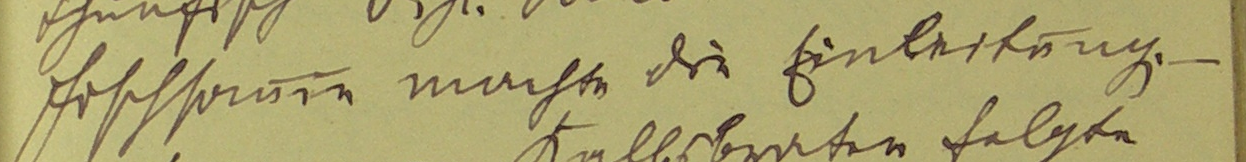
Fischforum machte die Einleitung.-
